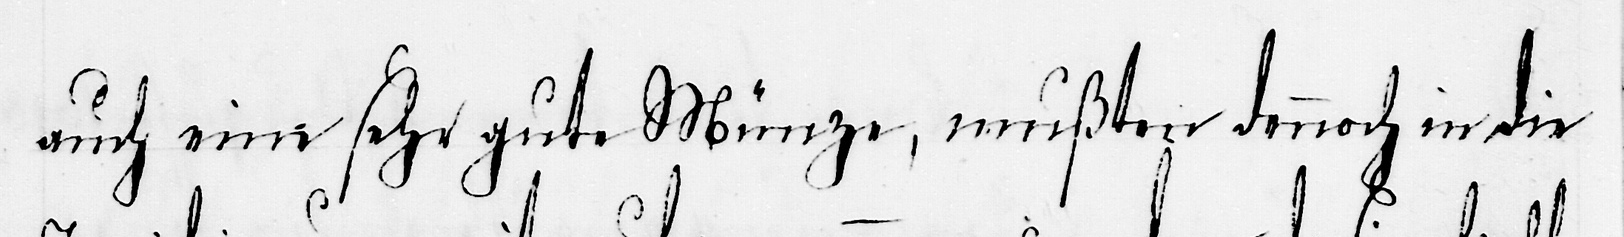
auch eine sehr gute Münze, mußten dennoch in die
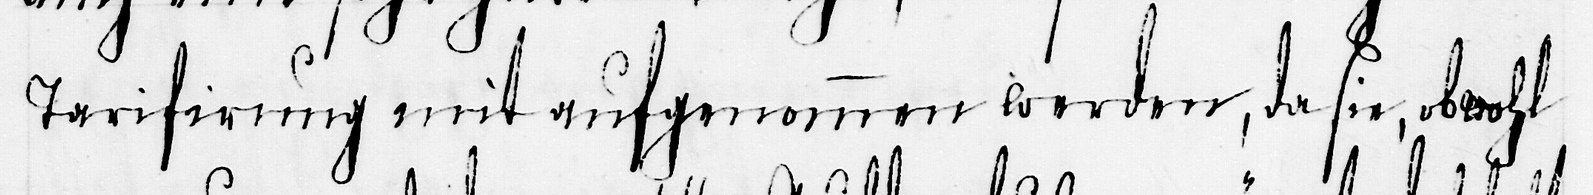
Tarifirung mit aufgenommen werden, da sie, obwohl
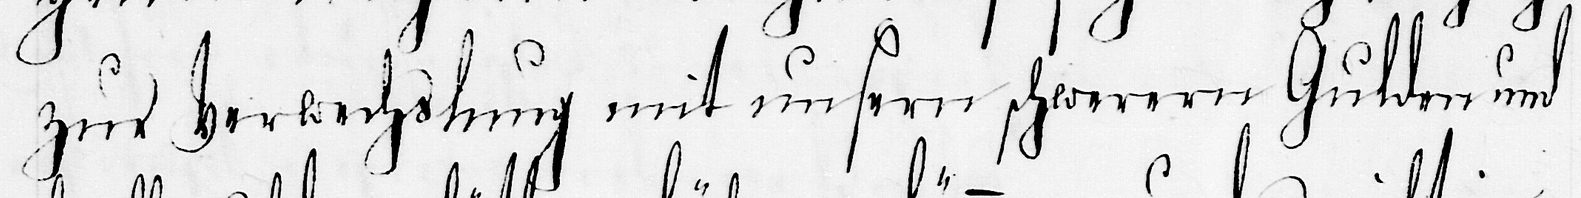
zur Verwechslung mit unsern schwerern Gulden und
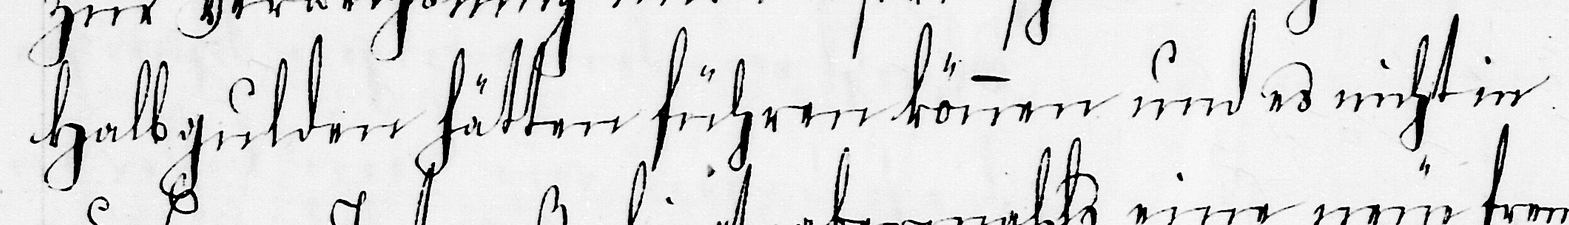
Halbgulden hätten führen können und es nicht in
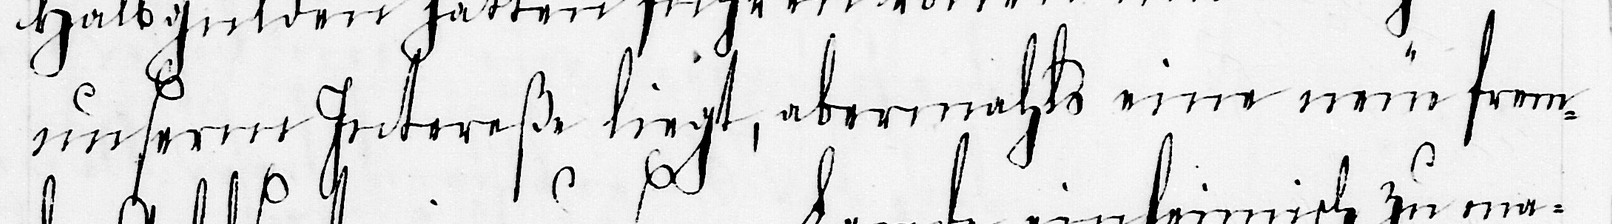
unserm Intereße liegt, abermahls eine neue frem¬
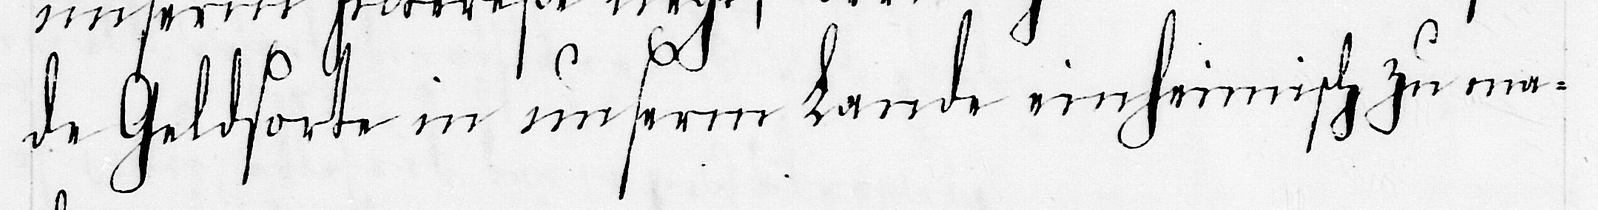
de Geldsorte in unserm Lande einheimisch zu ma¬
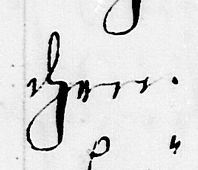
chen.
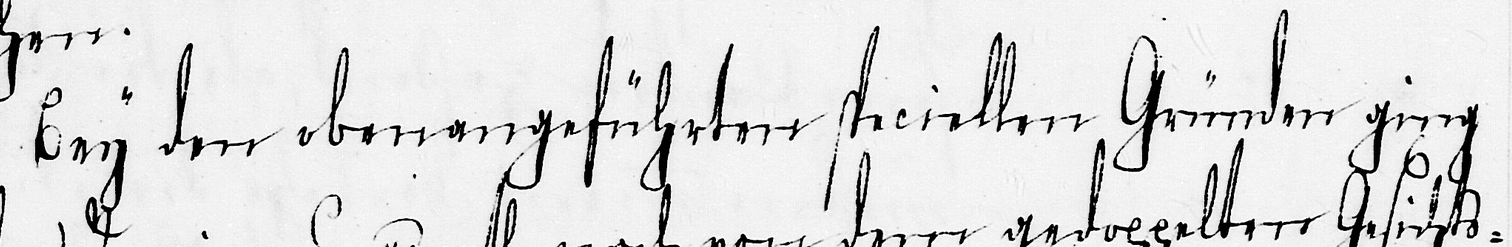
Bey den obenangeführten speciellen Gründen ging
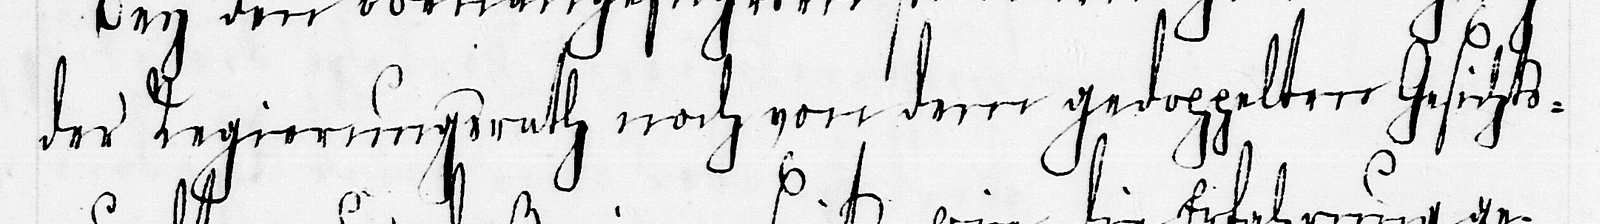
der Regierungsrath noch von dem gedoppelten Gesichts¬
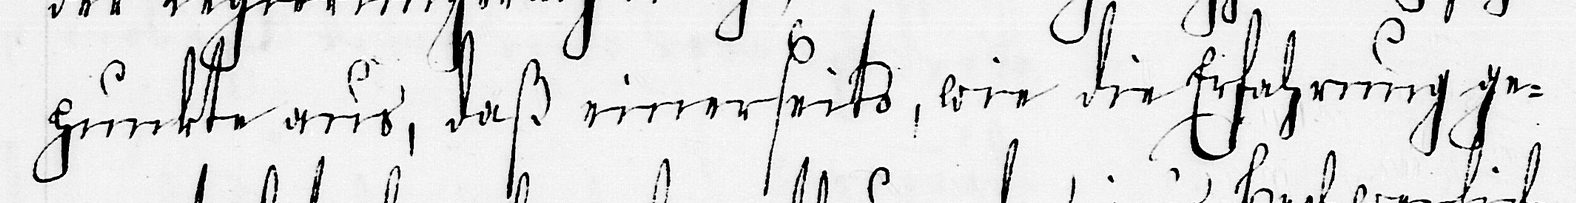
punkte aus, daß einerseits, wie die Erfahrung ge¬
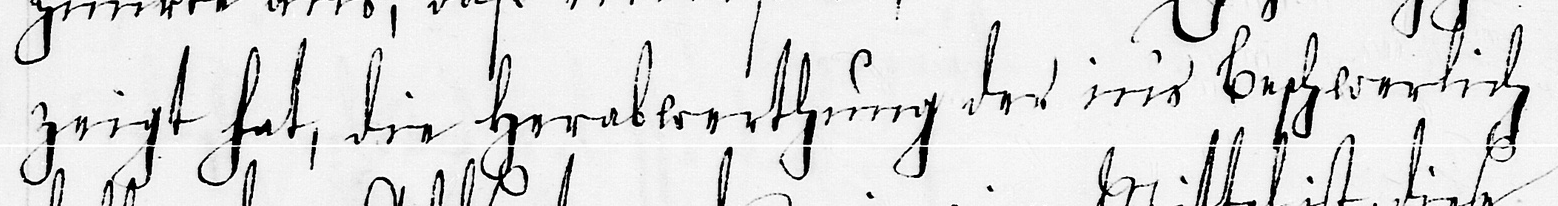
zeigt hat, die Herabwerthung der in’s Beschwerlich
